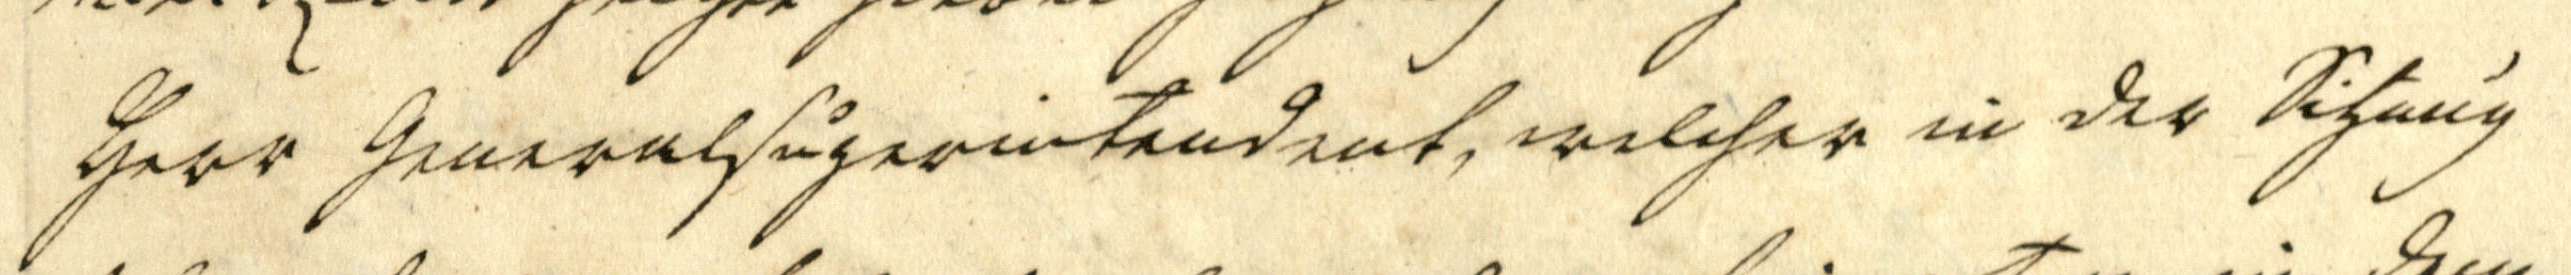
Herr Generalsuperintendent, welcher in der Sitzung
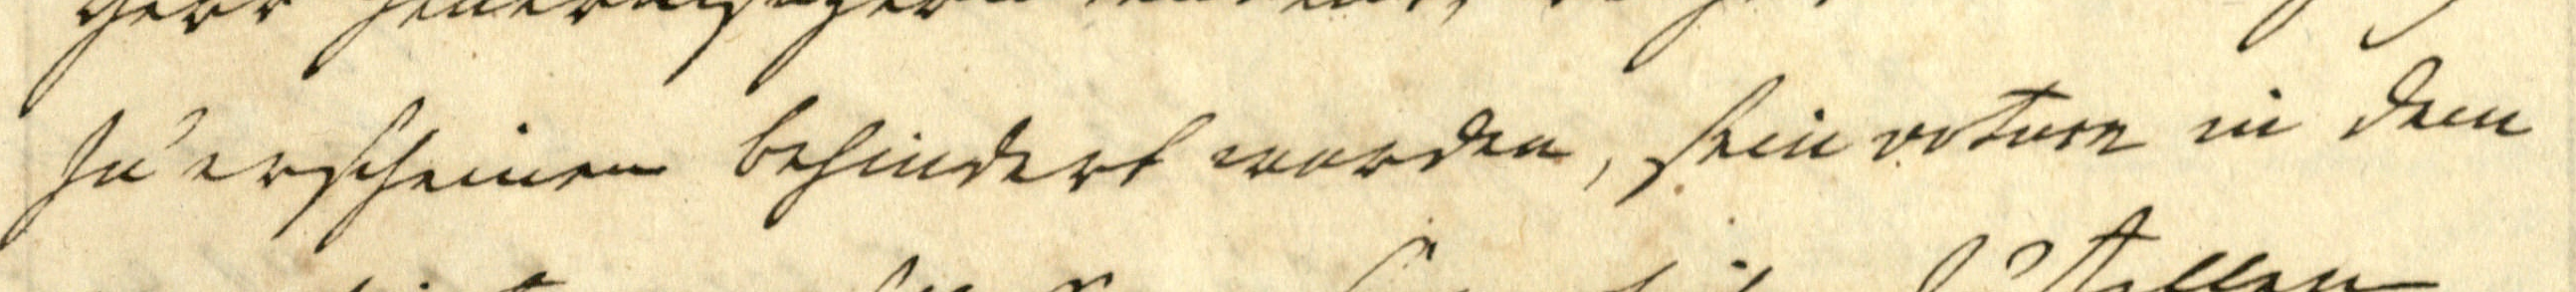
zu erscheinen behindert worden, sein votum in dem
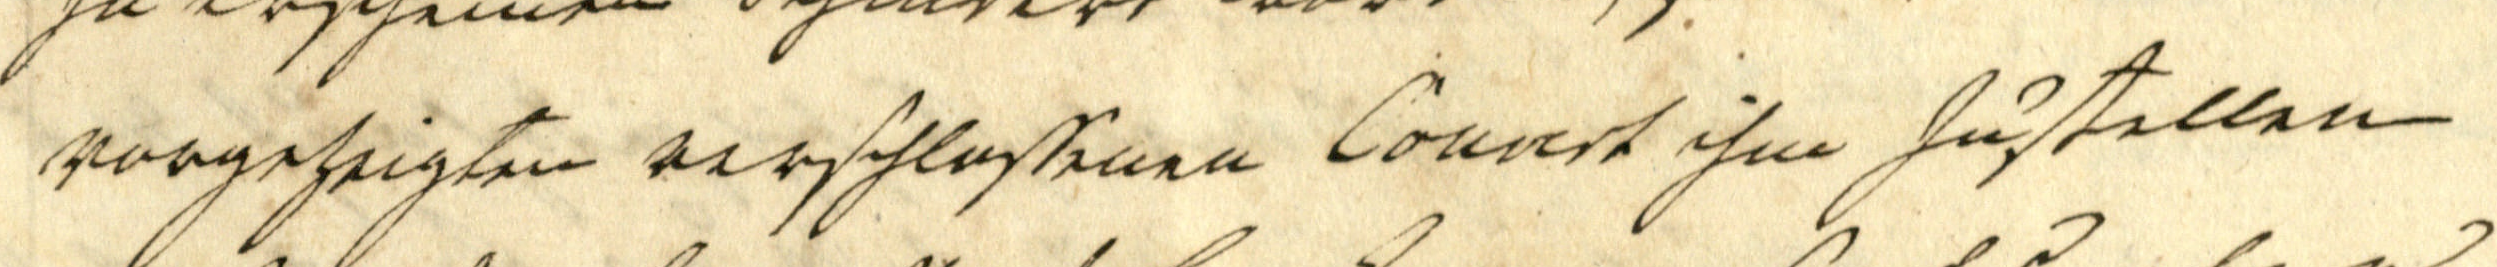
vorgezeigten verschlossenen Couvert ihm zustellen
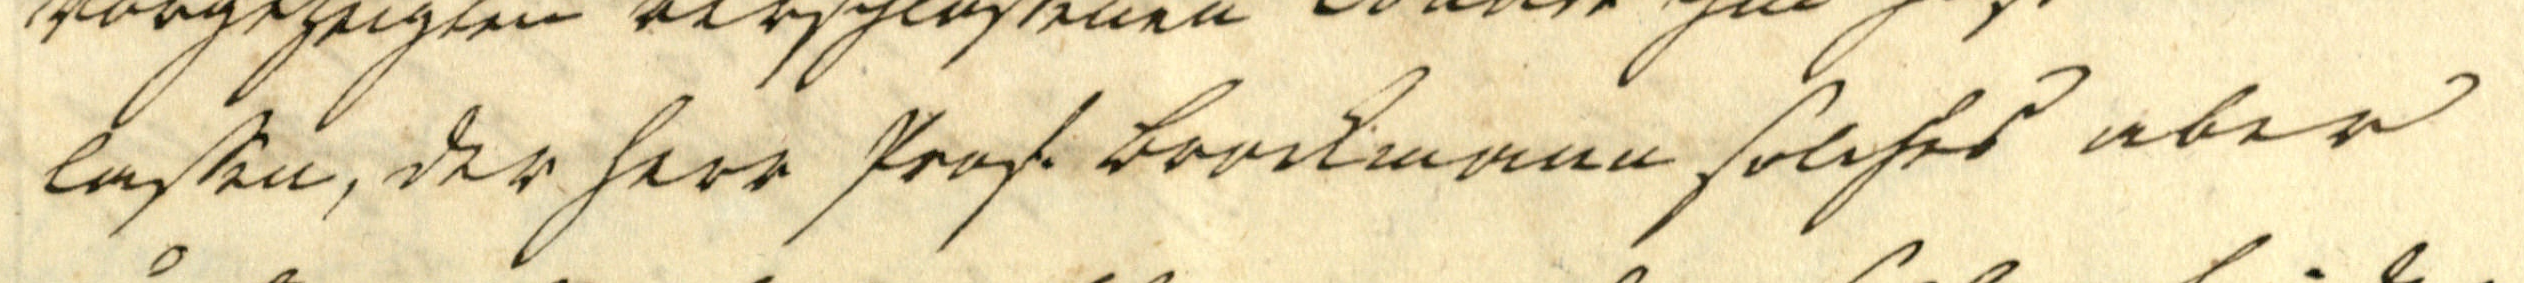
lassen, der Herr Prof. Brockmann solches aber
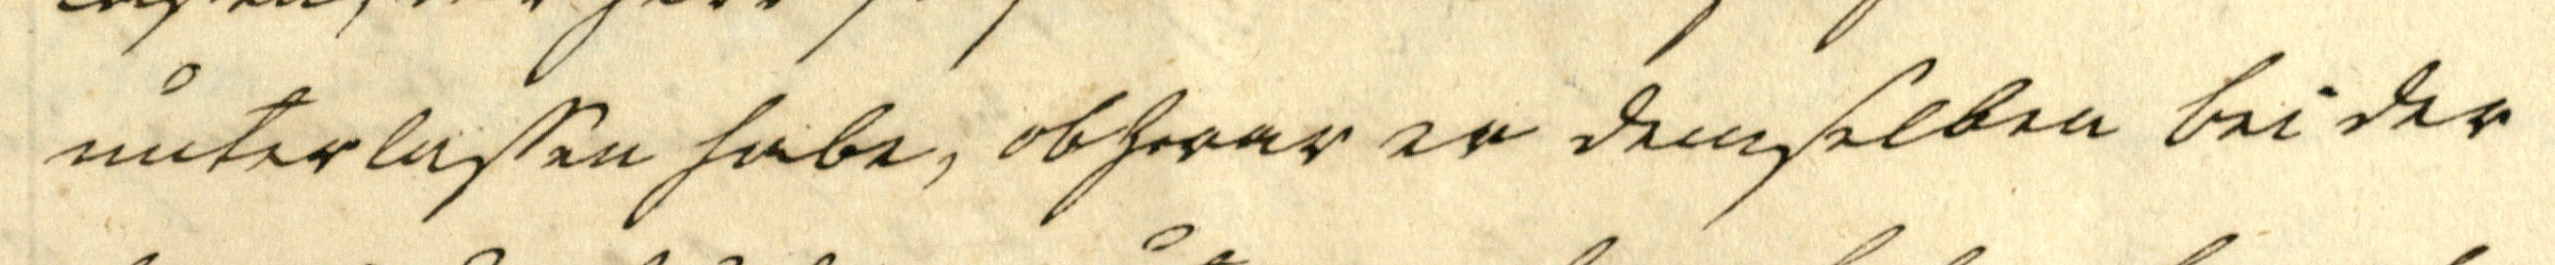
unterlassen habe, obzwar er demselben bei der
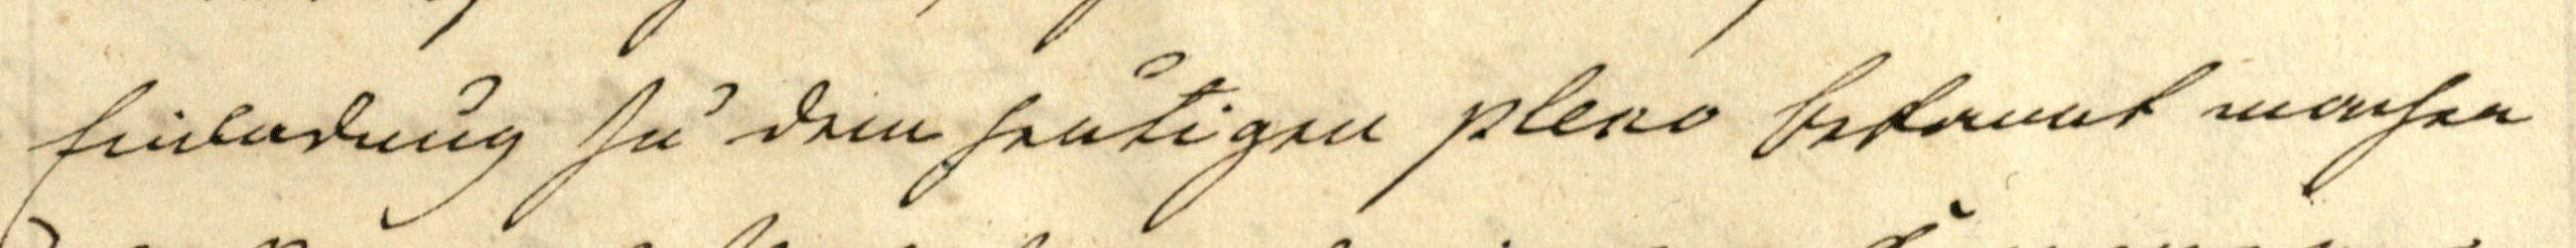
Einladung zu dem heutigen pleno bekannt machen
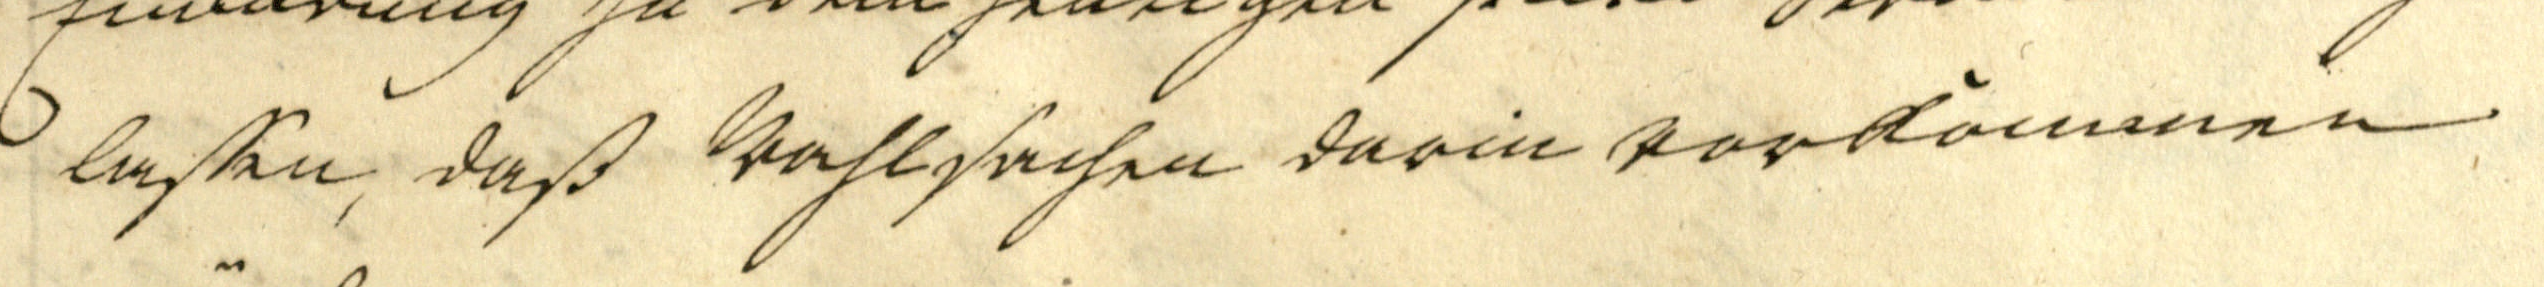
lassen, daß Wahlsachen darin vorkommen
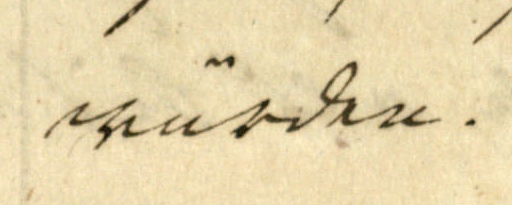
würden.
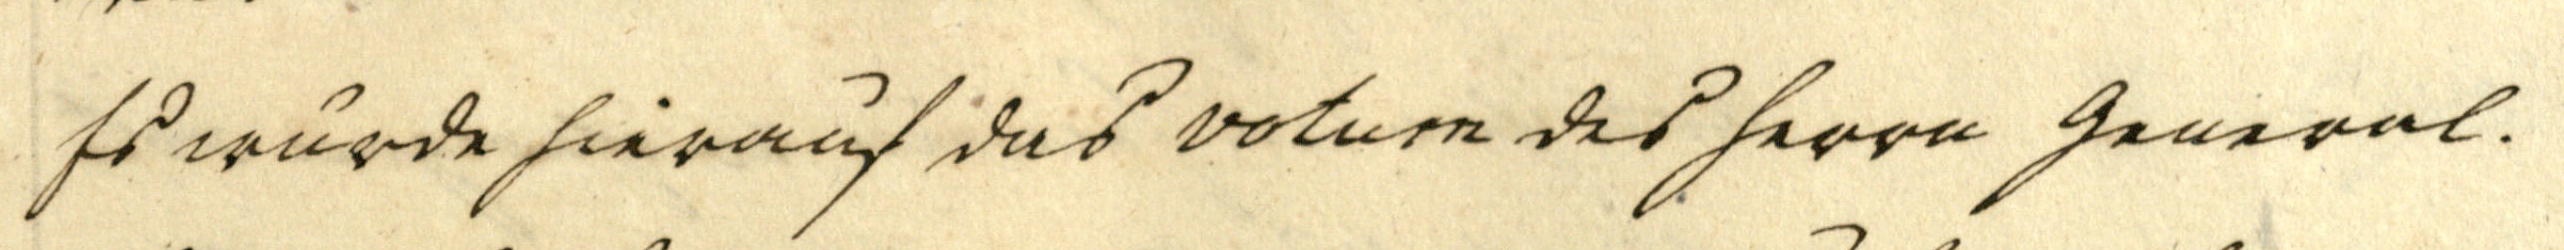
Es wurde hierauf das votum des Herrn General¬
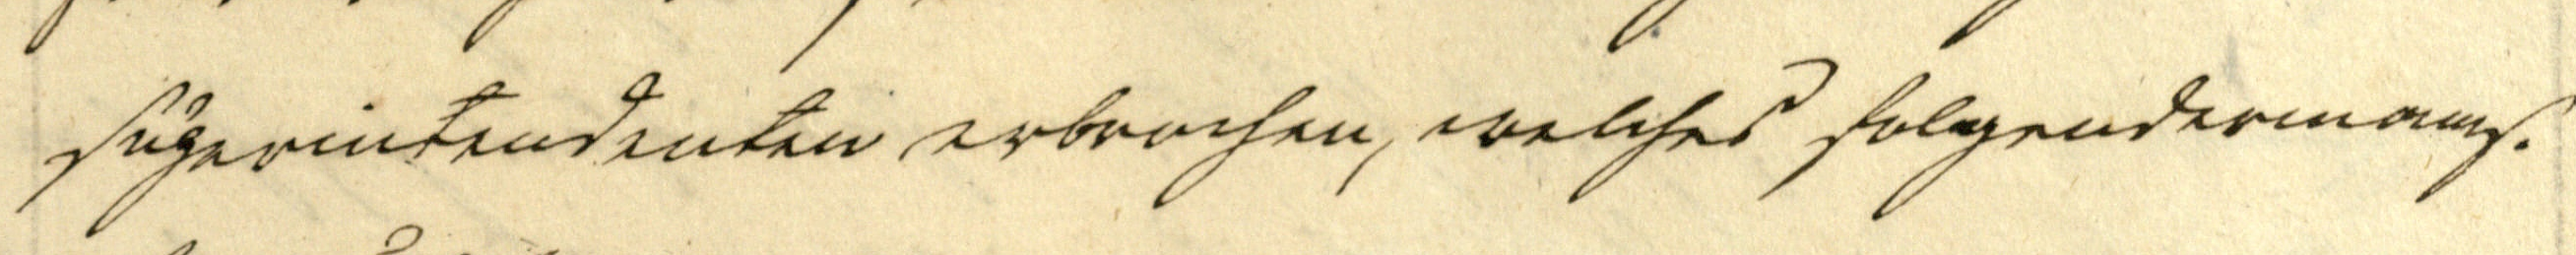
superintendenten erbrochen, welches folgendermaas¬
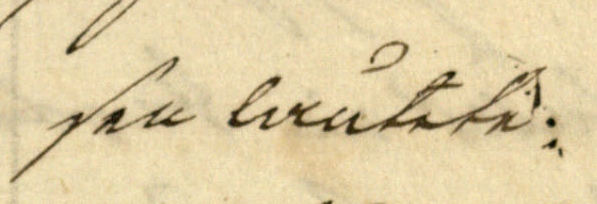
sen lautete:
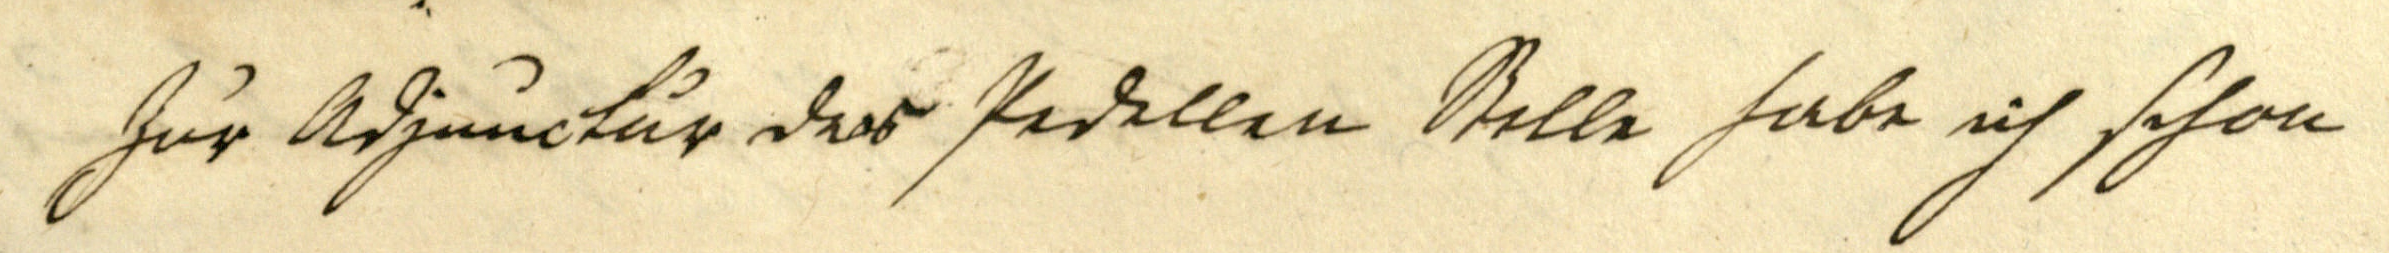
Zur Adjunctur der Pedellen Stelle habe ich schon
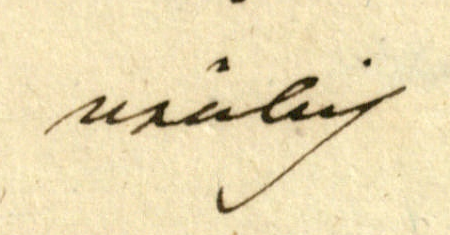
neulich
